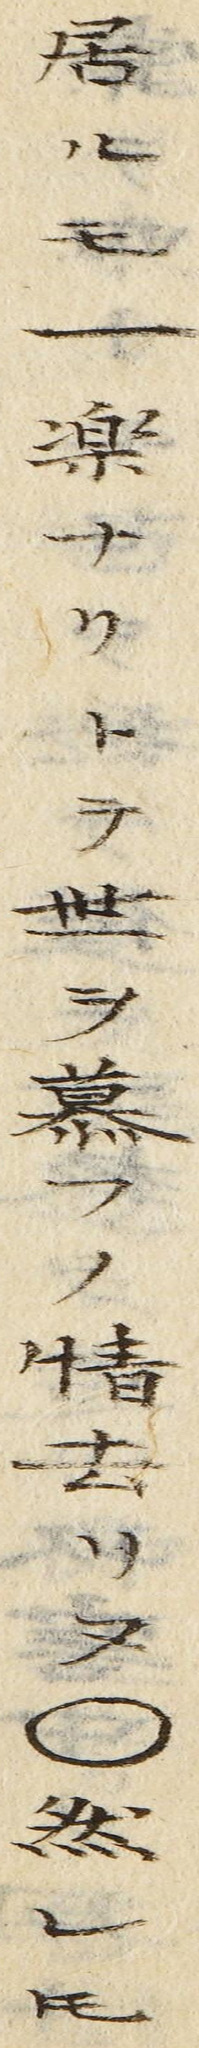居ルモ一楽ナリトテ世ヲ慕フノ情去リヌ◯然レトモ
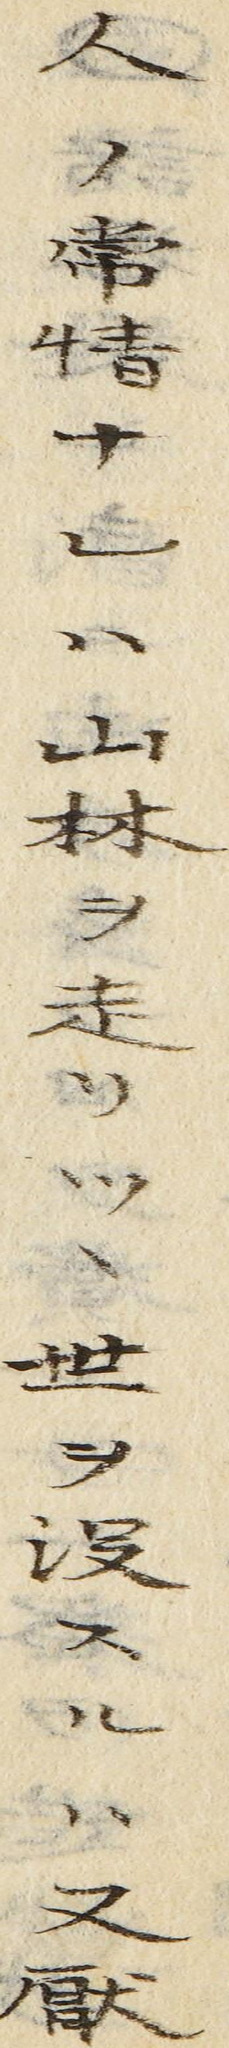人ノ常情ナレハ山林ヲ走リツヽ世ヲ没スルハ又厭
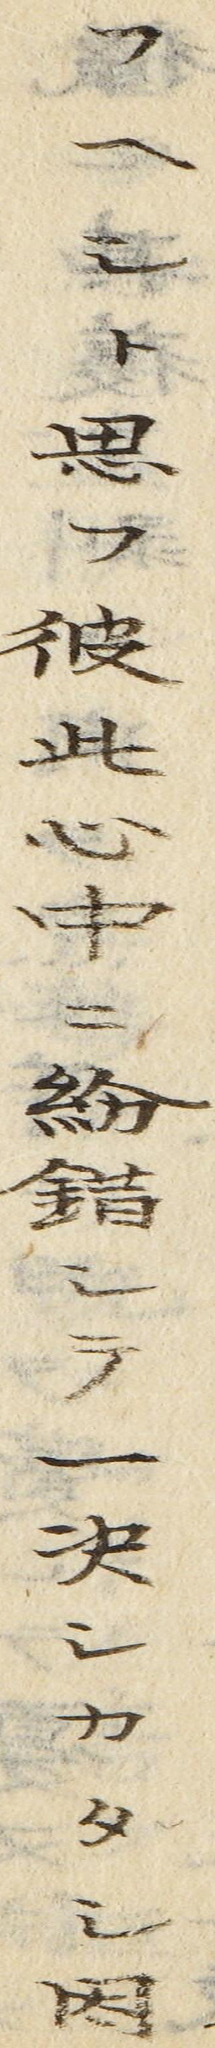フヘシト思フ彼此心中ニ紛錯シテ一決シカタシ因
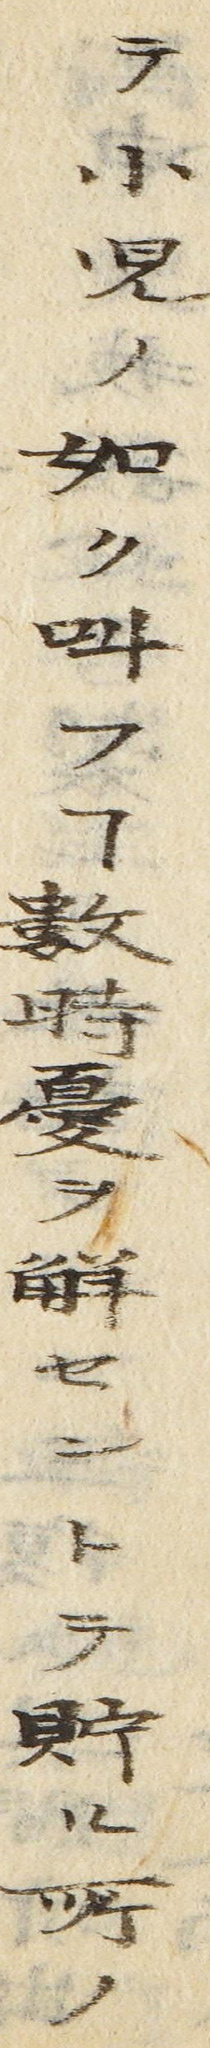テ小児ノ如ク叫フコト数時憂ヲ解セントテ貯ル所ノ
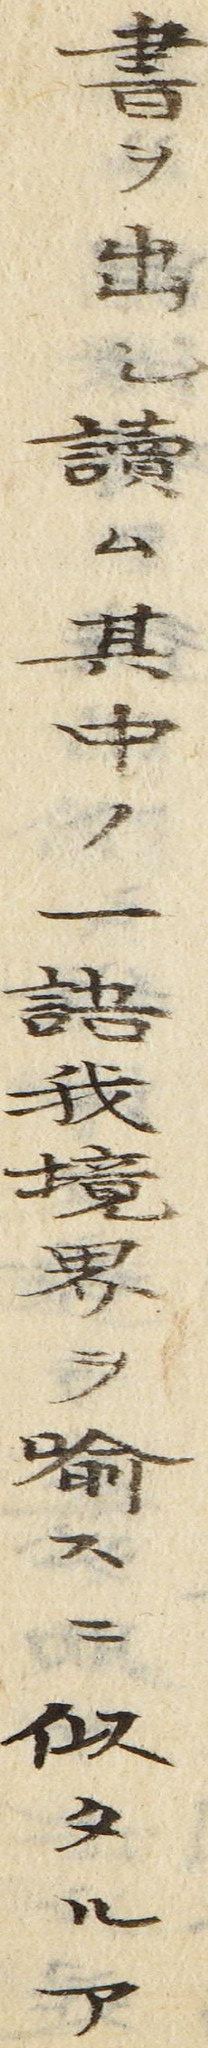書ヲ出シ読ム其中ノ一語我境界ヲ喩スニ似タルア

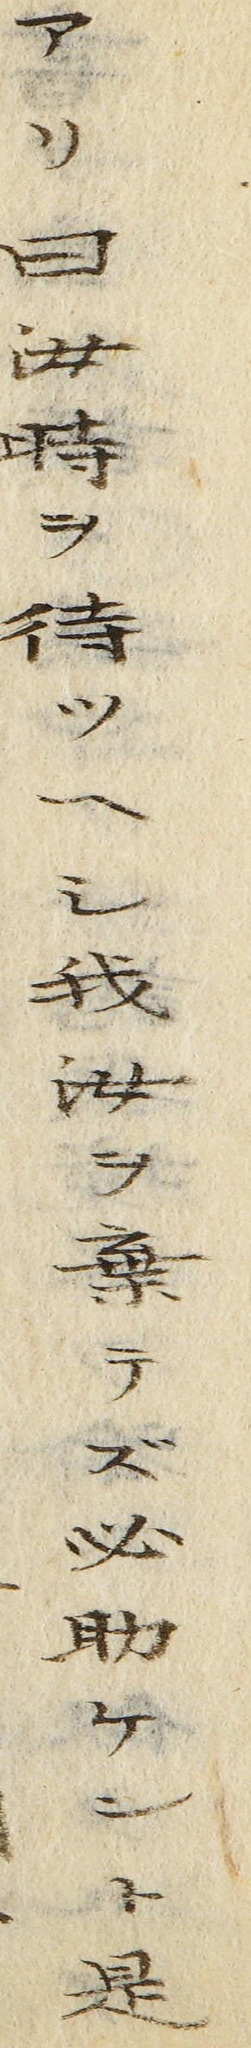アリ曰汝時ヲ待ツヘシ我汝ヲ棄テズ必助ケント是
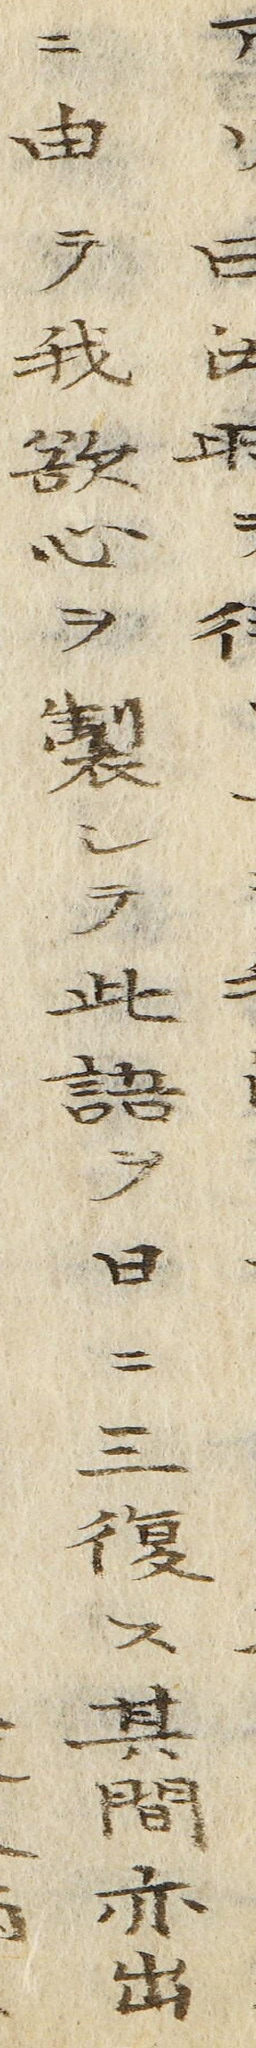ニ由テ我欲心ヲ製シテ此語ヲ日ニ三復ス其間亦出
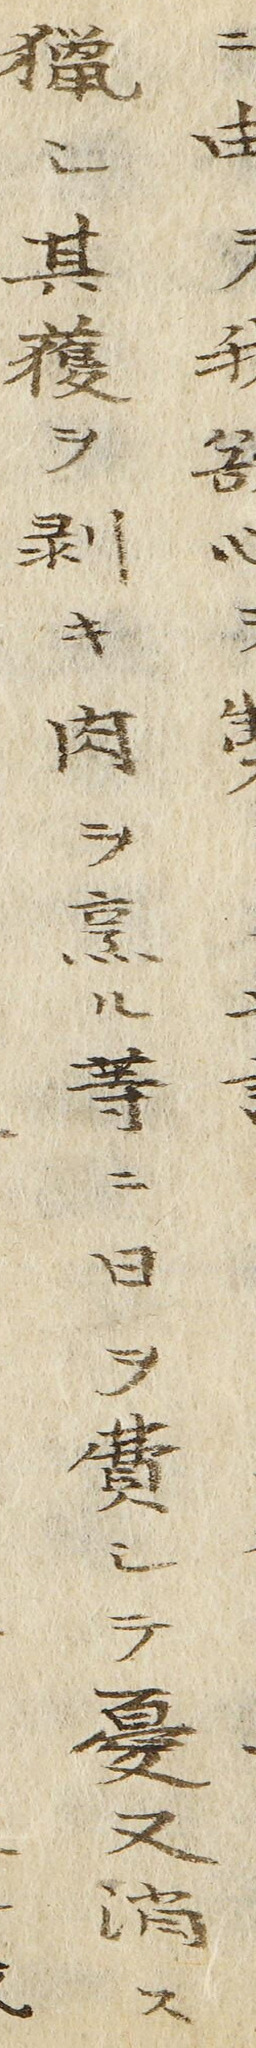猟シ其獲ヲ剝キ肉ヲ烹ル等ニ日ヲ費シテ憂又消ス
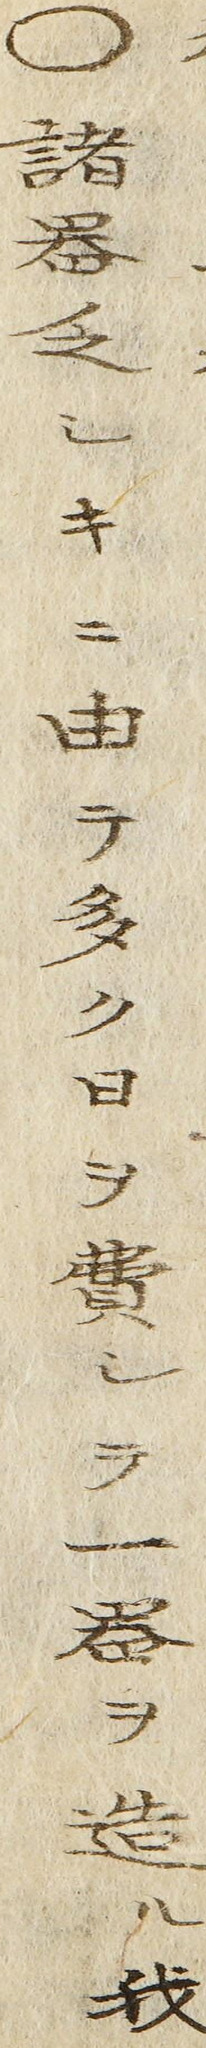◯諸器乏シキニ由テ多ク日ヲ費シテ一器ヲ造ル我
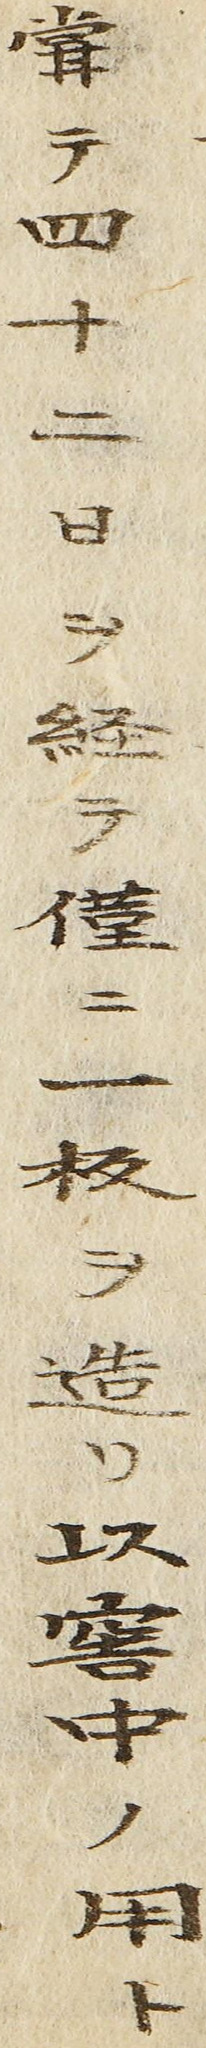嘗テ四十二日ヲ経テ僅ニ一板ヲ造リ以窖中ノ用ト
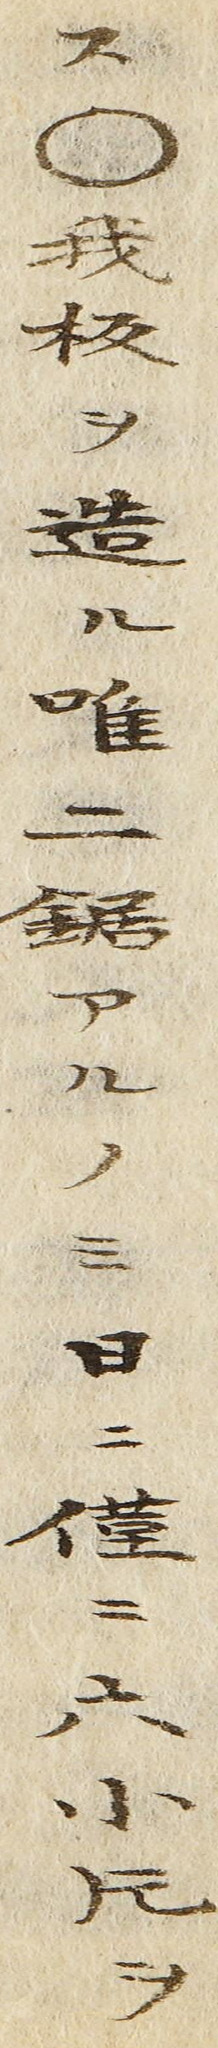ス◯我板ヲ造ル唯二鋸アルノミ日ニ僅ニ六小片ヲ
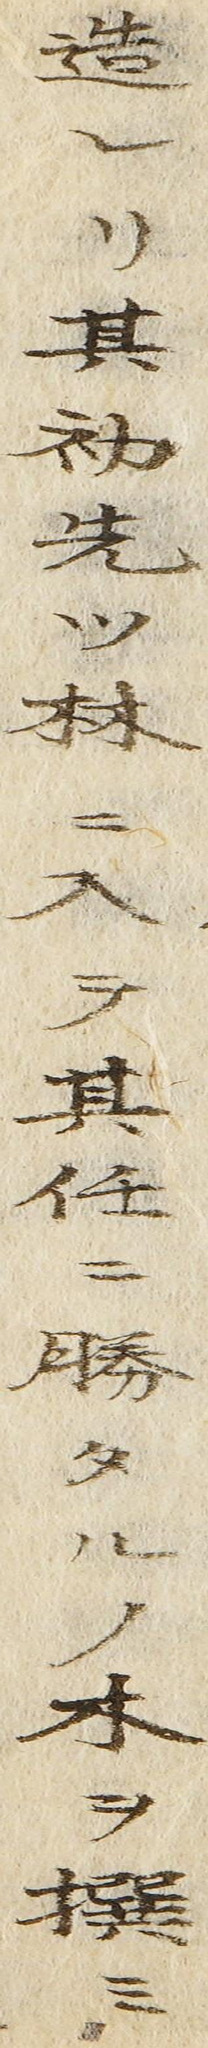造レリ其初先ツ林ニ入テ其任ニ勝タルノ木ヲ撰ミ
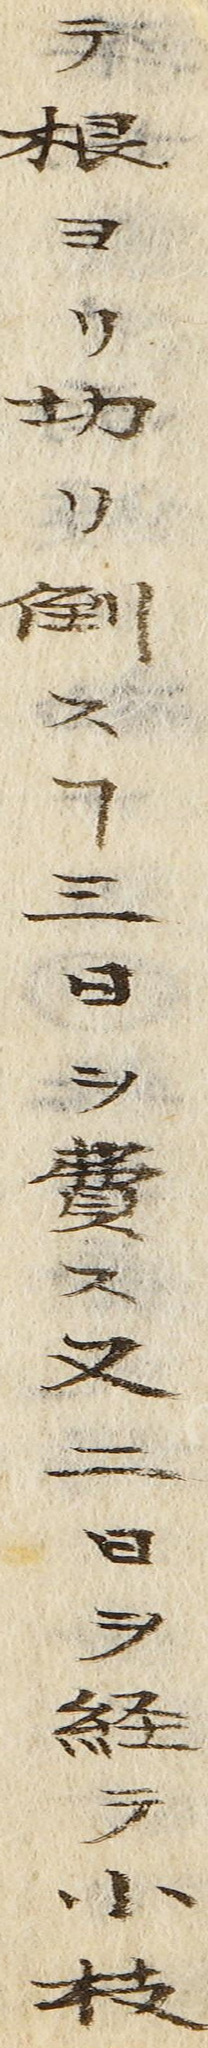テ根ヨリ切リ倒スコト三日ヲ費ス又二日ヲ経テ小枝
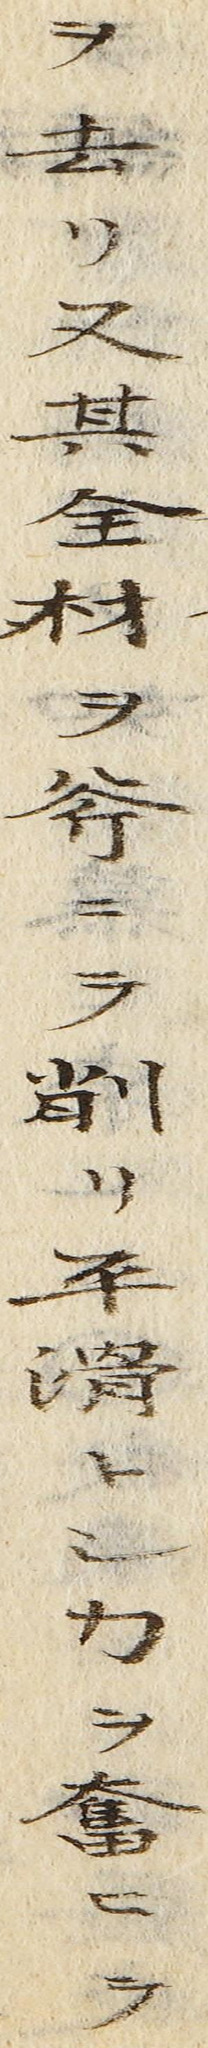ヲ去リ又其全材ヲ斧ニテ削リ平滑トシ力ヲ奮ヒテ
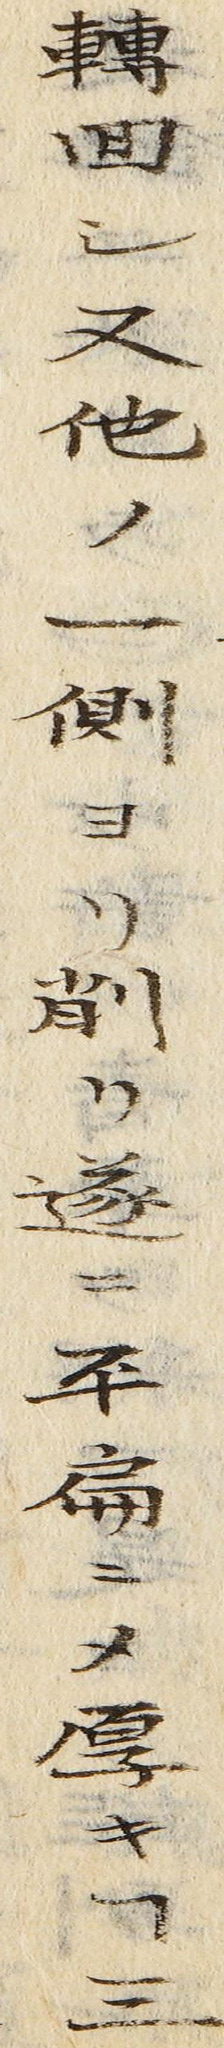転回シ又他ノ一側ヨリ削リ遂ニ平扁ニシテ厚キコト三
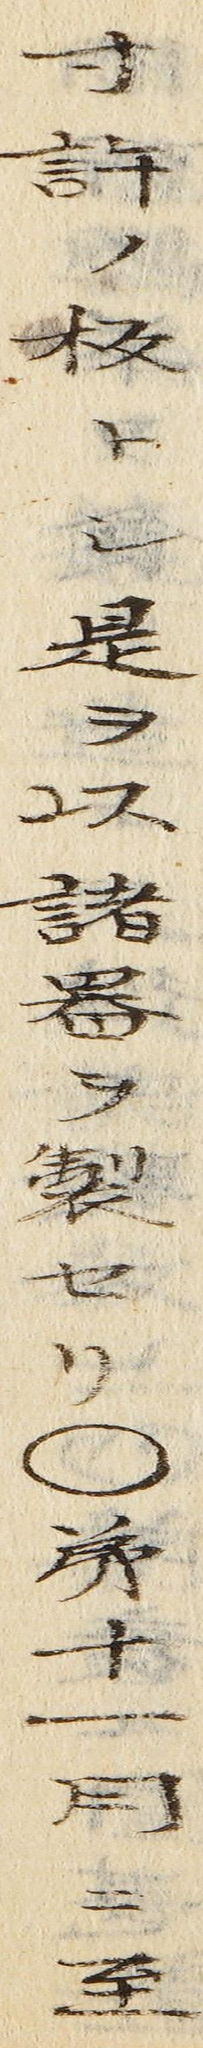寸許ノ板トシ是ヲ以諸器ヲ製セリ◯第十一月ニ至
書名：漂流紀事
